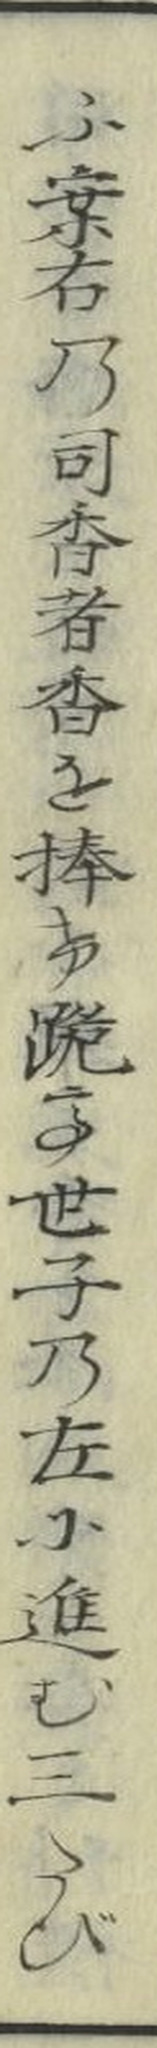ふ案右の司香者香を捧け跪て世子の左に進む三たび
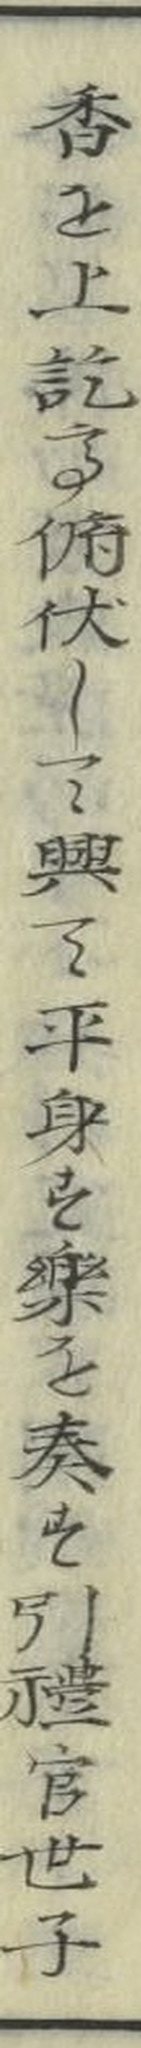香を上訖て俯伏して興て平身す楽を奏す引礼官世子
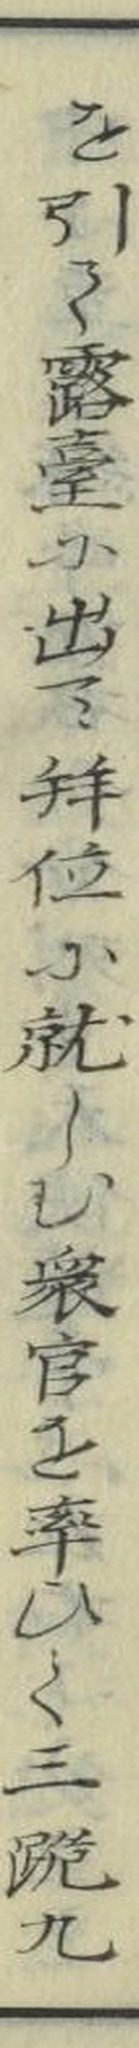を引て露台に出て拝位に就しむ衆官を率ひて三跪九
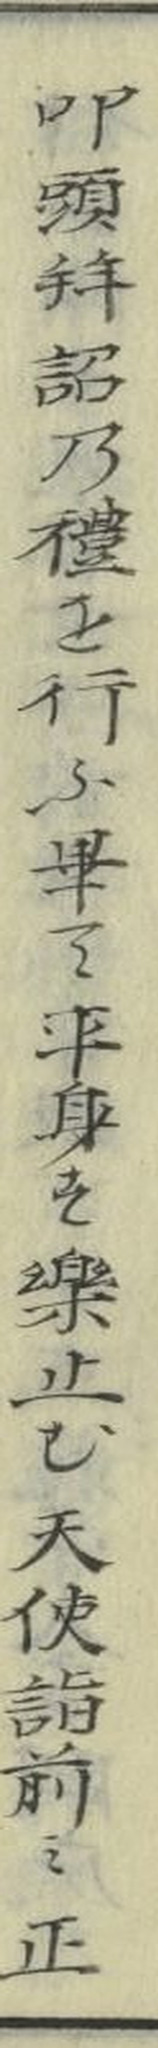叩頭拝詔の礼を行ふ畢て平身す楽止む天使詣前み正
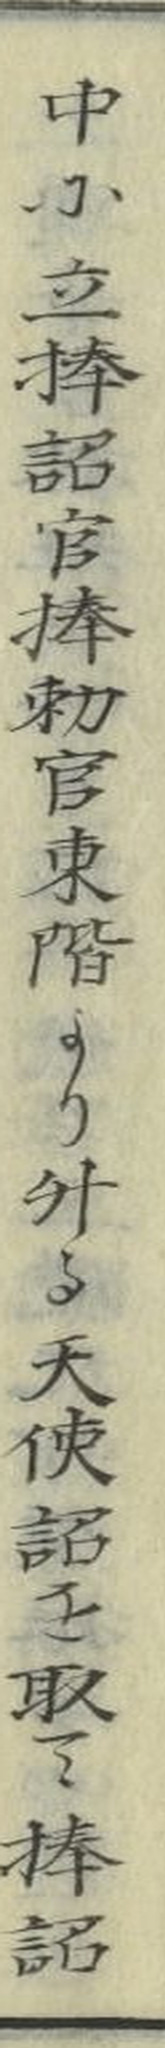中に立捧詔官捧勅官東階より升る天使詔を取て捧詔
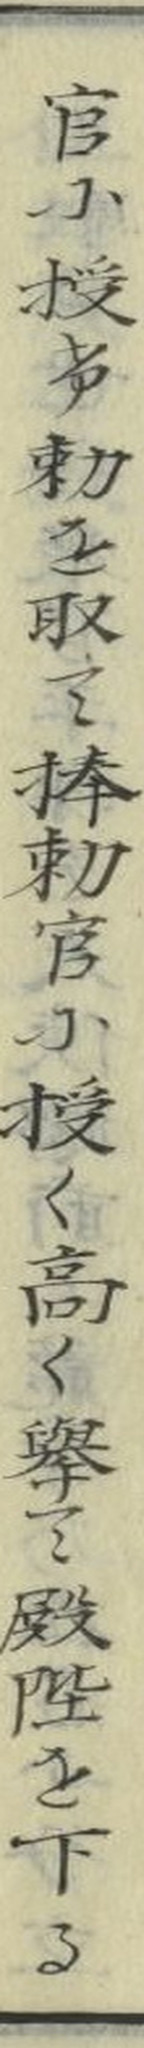官に授け勅を取て捧勅官に授く高く挙て殿陛を下る
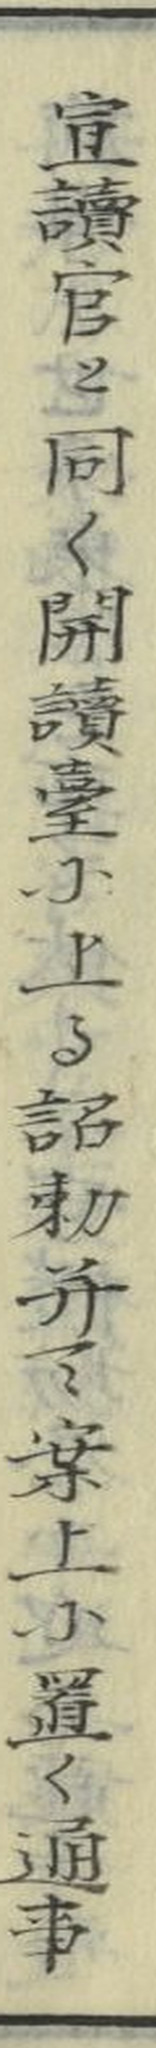宣読官と同く開読台に上る詔勅并て案上に置く通事
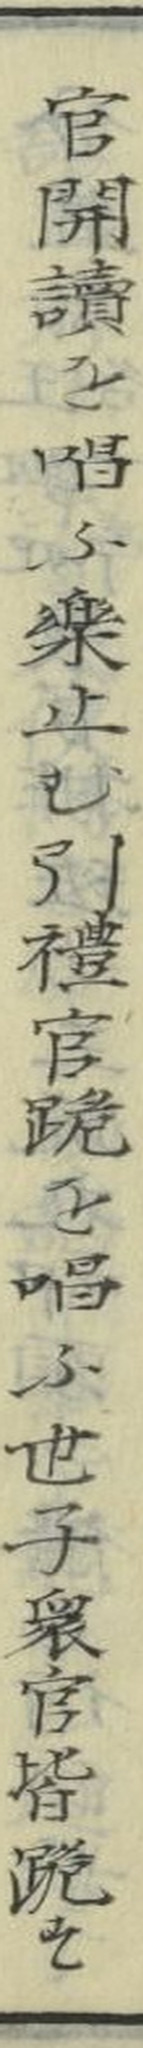官開読を唱ふ楽止む引礼官跪を唱ふ世子衆官皆跪す
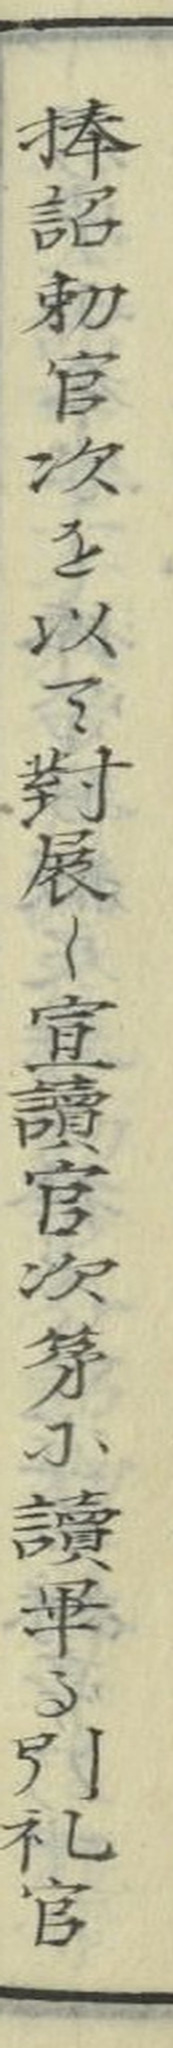捧詔勅官次を以て対展し宣読官次第に読畢る引礼官
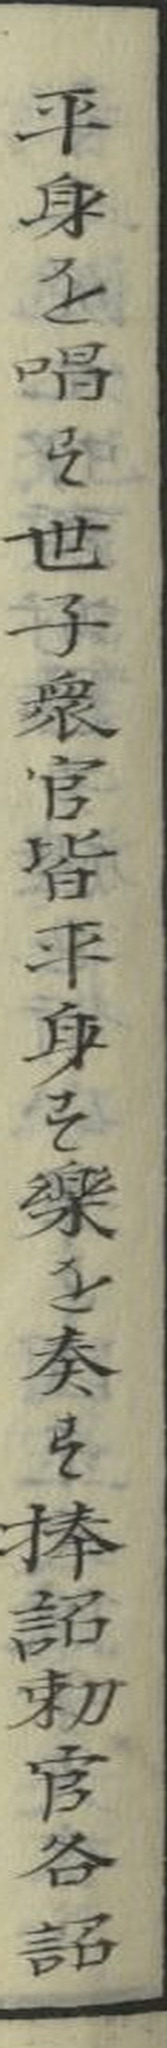平身を唱す世子衆官皆平身す楽を奏す捧詔勅官各詔
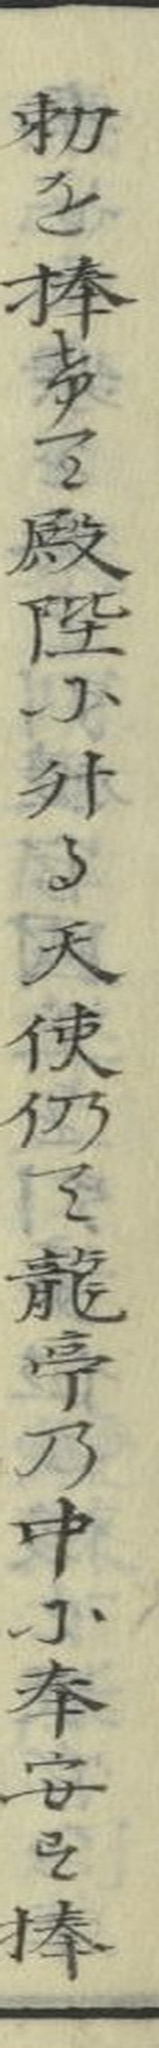勅を捧けて殿陛に升る天使仍て龍亭の中に奉安す捧
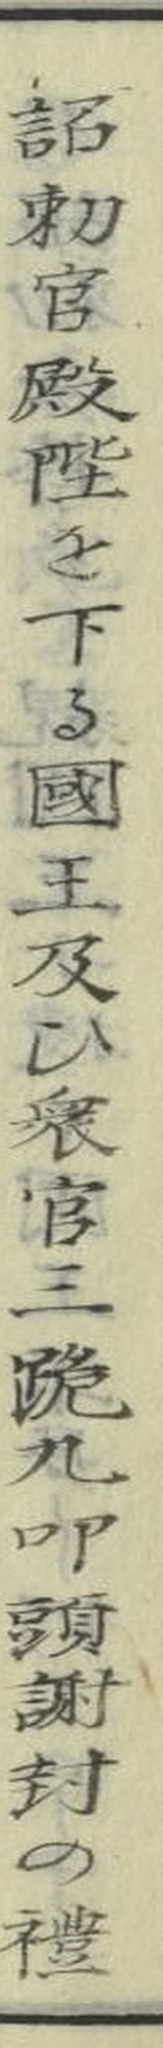詔勅官殿陛を下る国王及ひ衆官三跪九叩頭謝封の礼
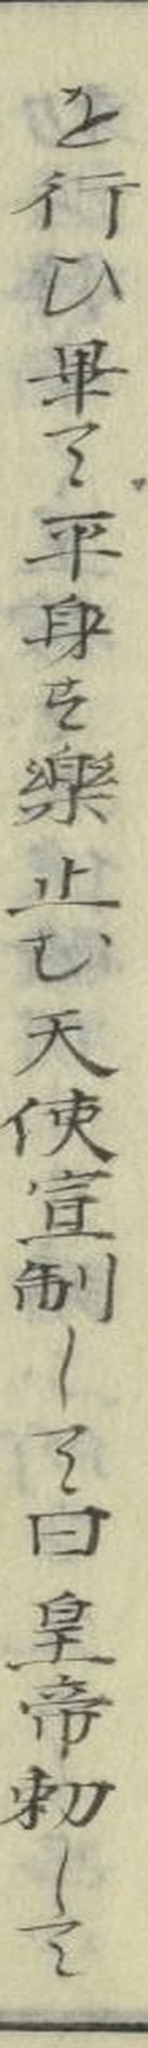を行ひ畢て平身す楽止む天使宣制して曰皇帝勅して
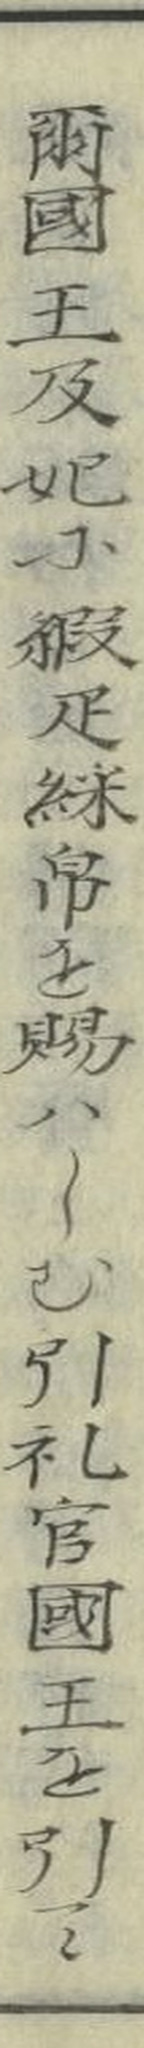爾国王及妃に縀疋䋛帛を賜はしむ引礼官国王を引て
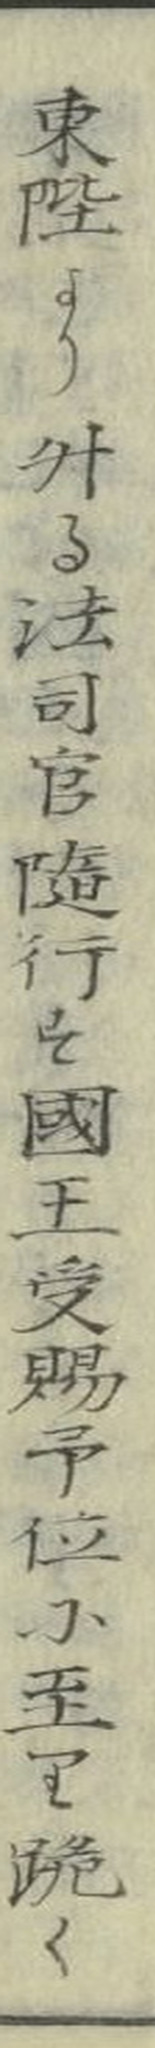東陛より升る法司官随行す国王受賜予位に至り跪く
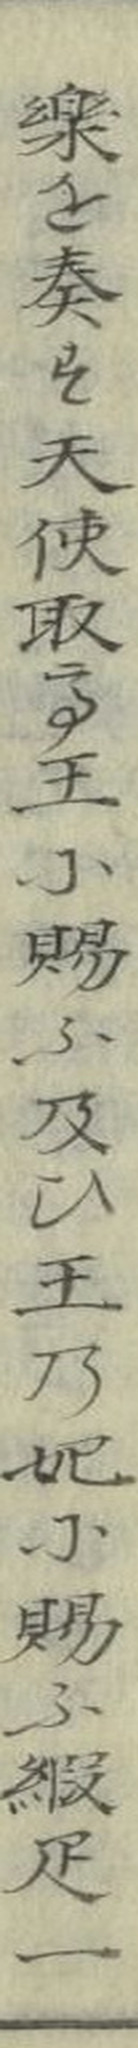楽を奏す天使取て王に賜ふ及ひ王の妃に賜ふ縀疋一
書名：琉球沿革志 下
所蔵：University of the Ryukyus Library
